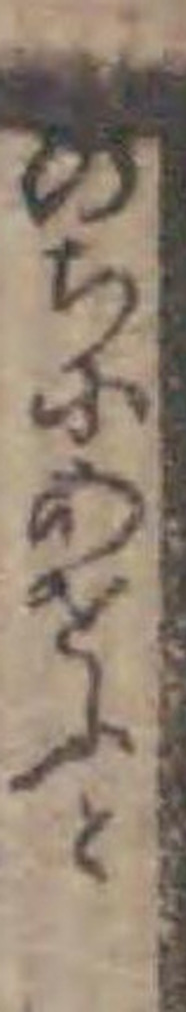のちにめをふと
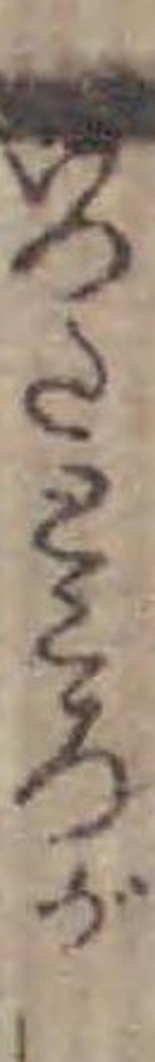いつたところが
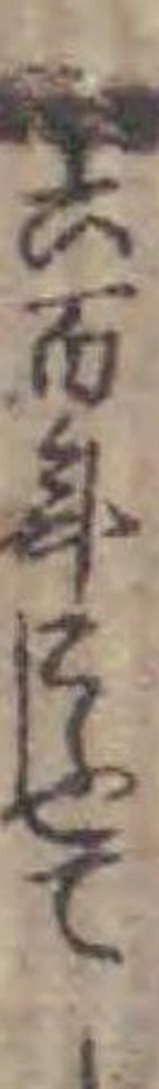六百年こふして
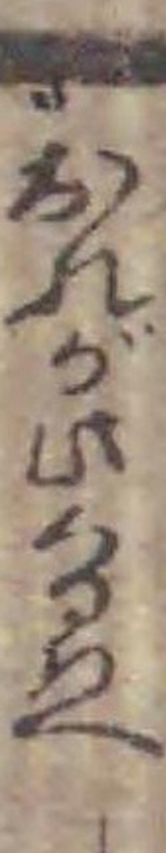おれが此くるはへ
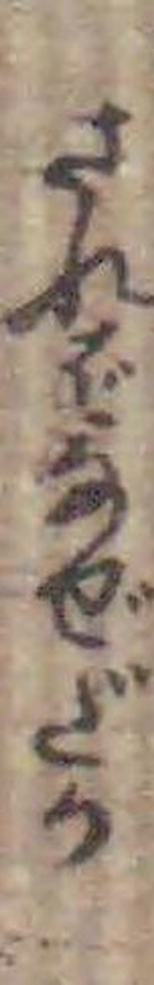さればなぜだか
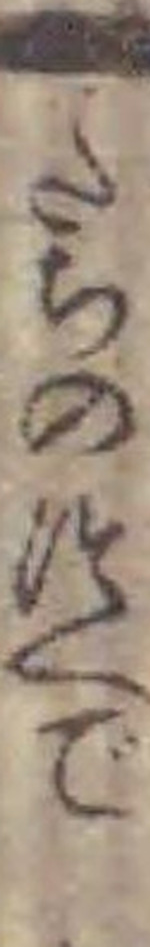たちのつへで
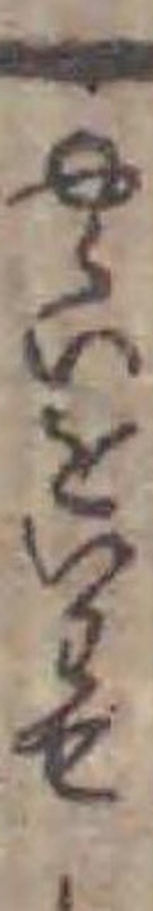やらいをいわせ
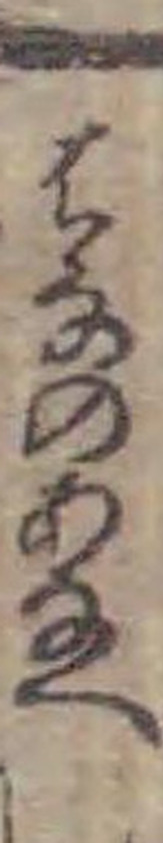はなのあなへ
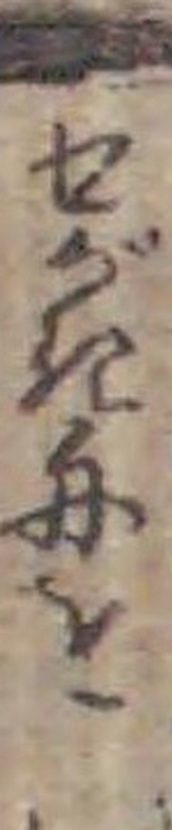せがき舟を
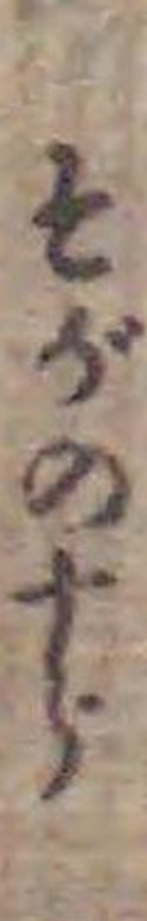そがの十郎
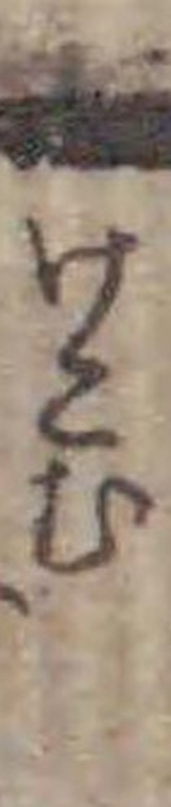けこむ
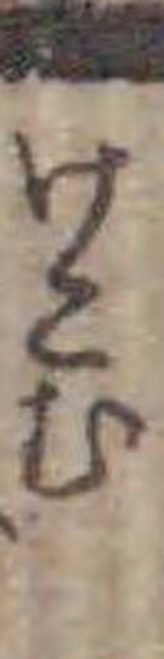けこむ
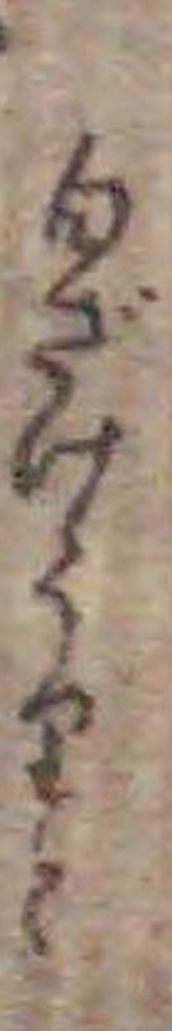白ざけうりと
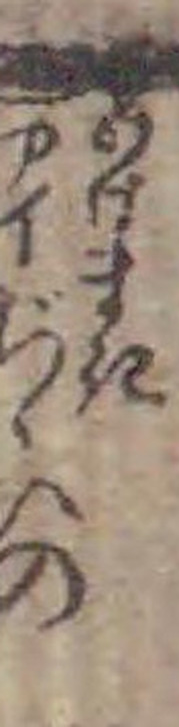ゝいの
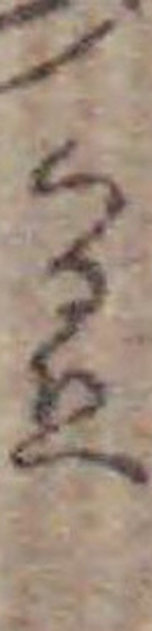くるはへ
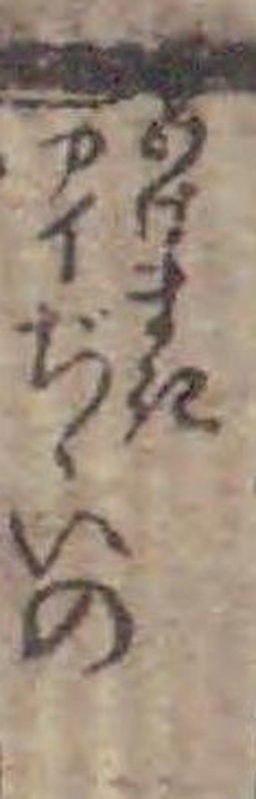ゝいの
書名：年寄之冷水曽我 : 3巻
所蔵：国立国会図書館 National Diet Library, JAPAN
